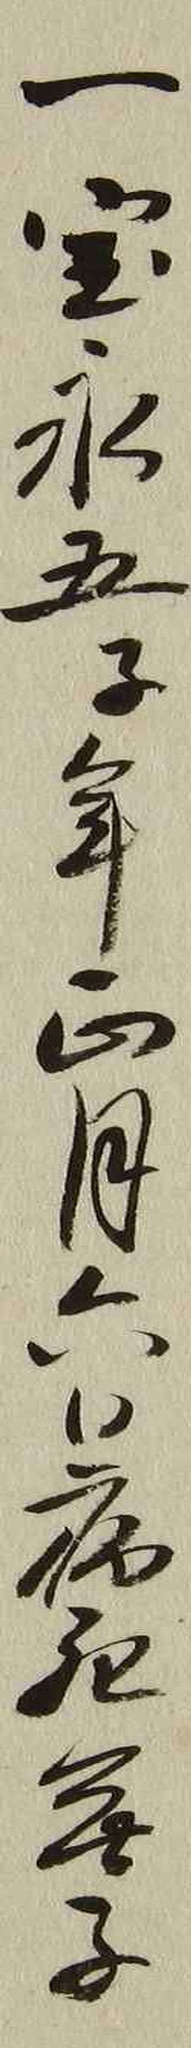一宝永五子年正月六日病死弟子
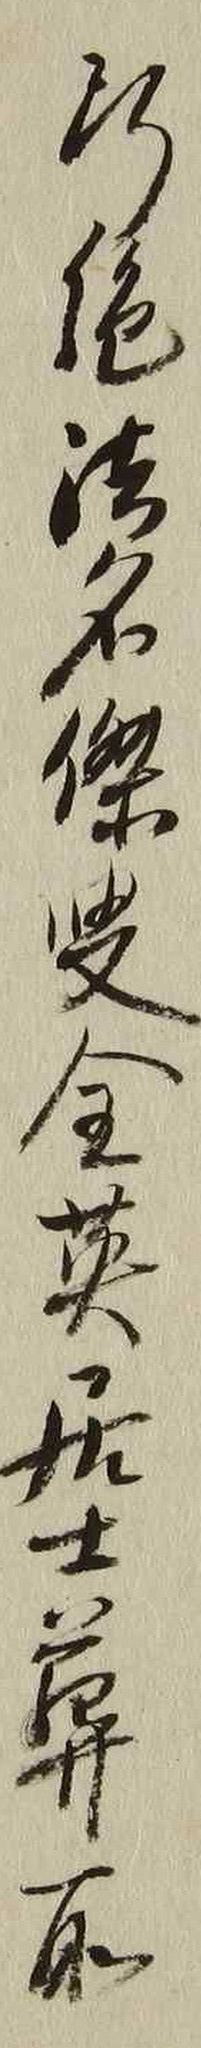断絶法名傑叟全英居士葬所
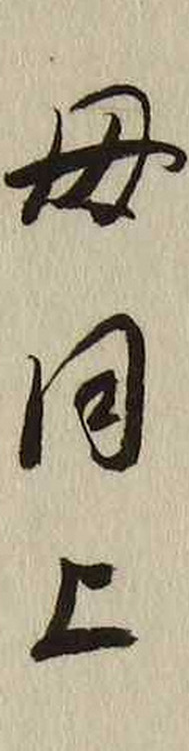母同上
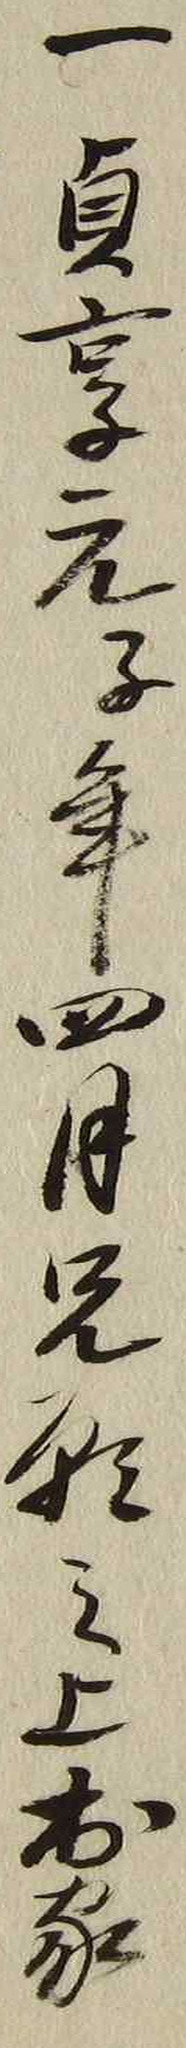一貞享元子年四月兄願之上出家
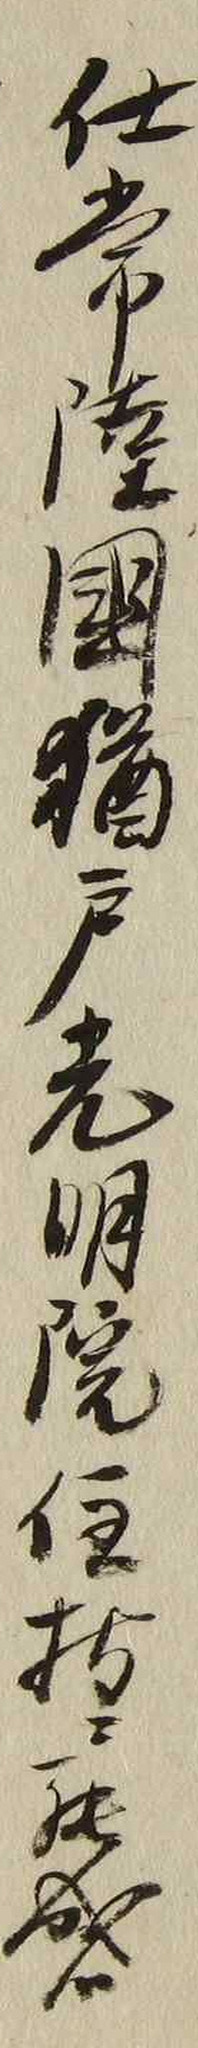仕常陸国猶戸光明院住持ニ罷成候
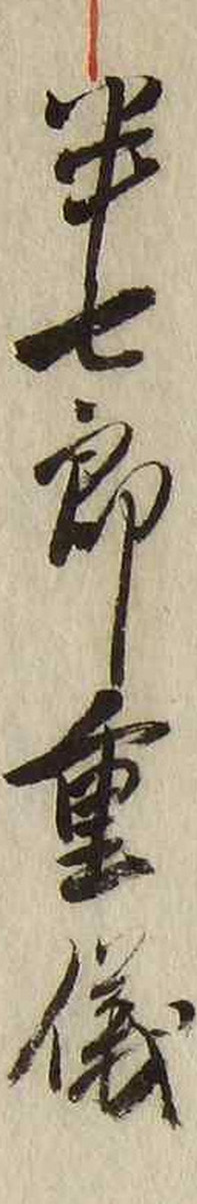半七郎重儀

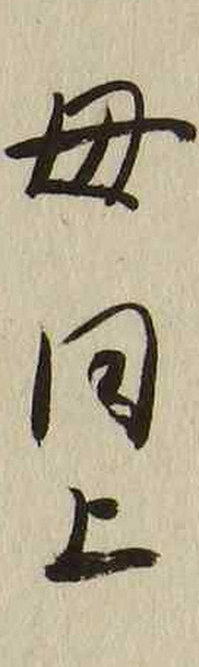母同上
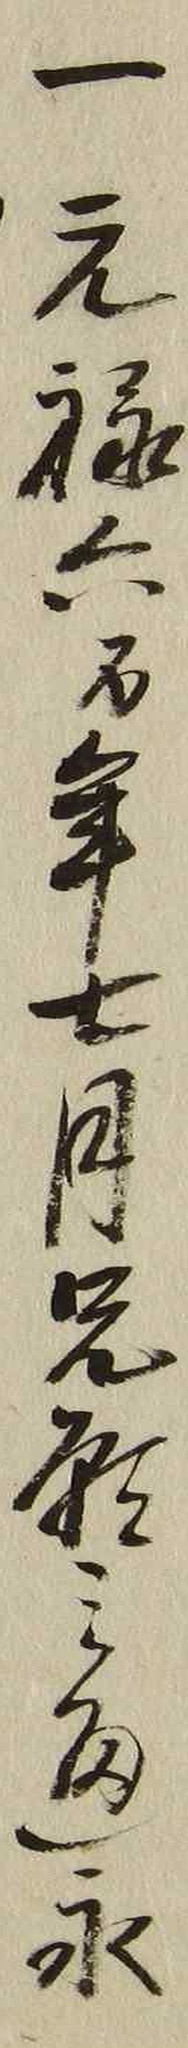一元禄六酉年七月兄願之通永
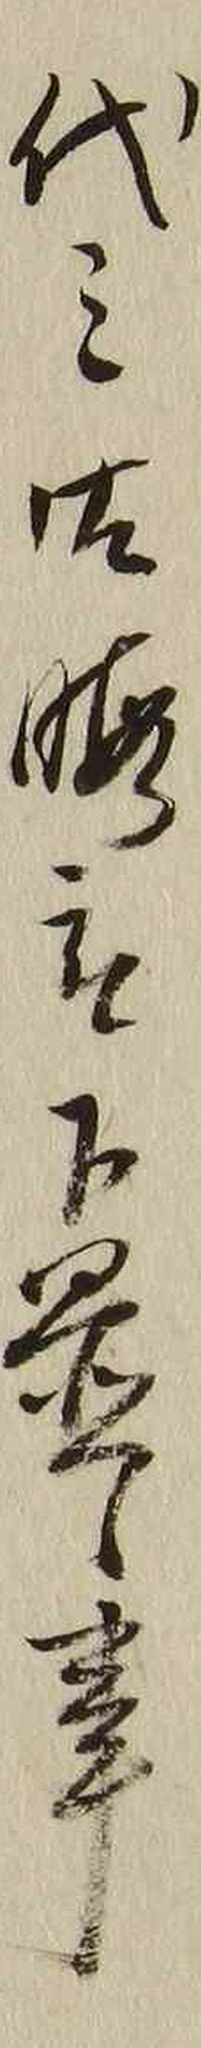代之御暇被下置候事
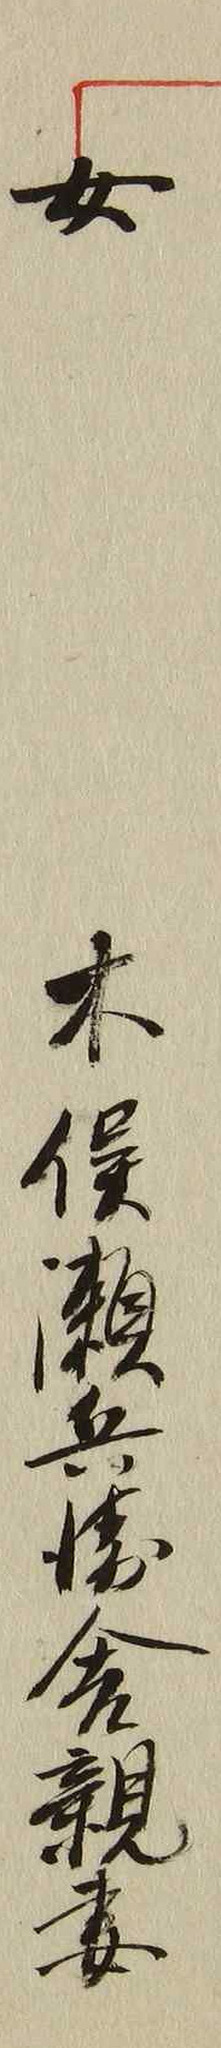女木俣瀬兵衛舎親妻
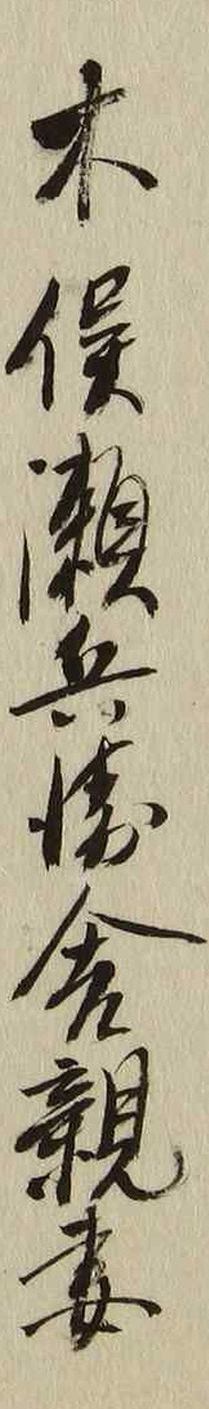女木俣瀬兵衛舎親妻
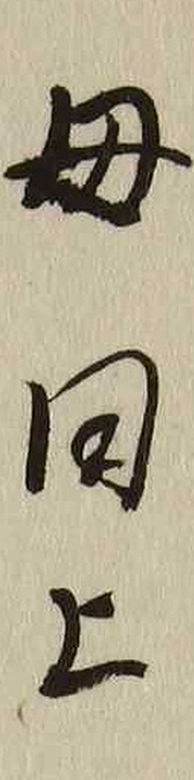母同上
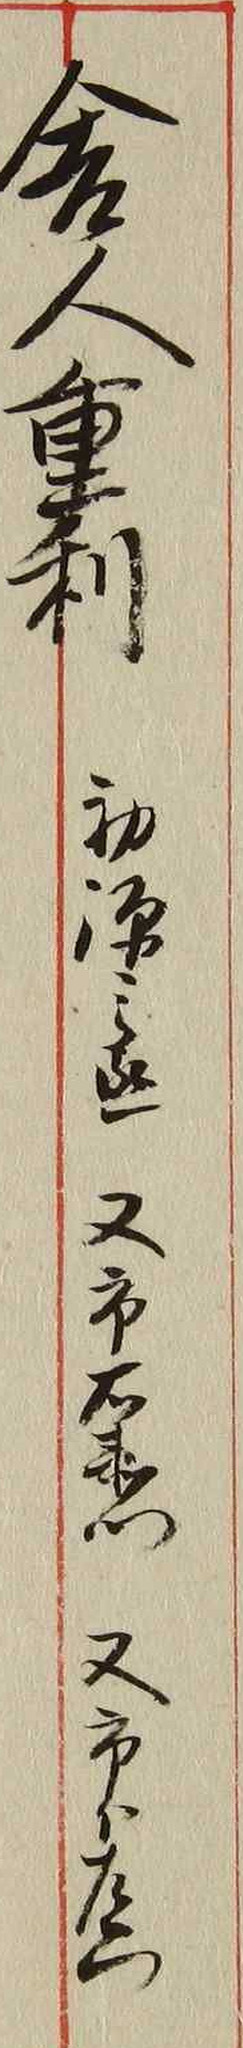舎人重利初源之丞又市右衛門又市郎左衛門
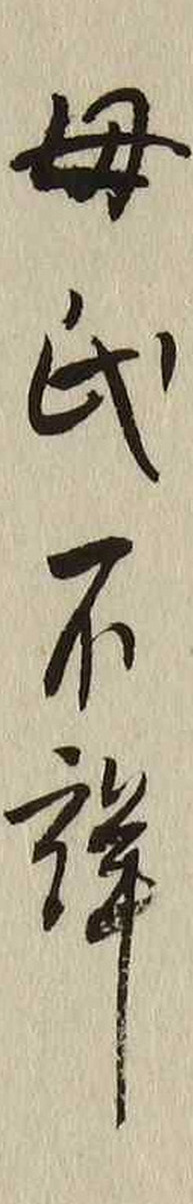母氏不詳
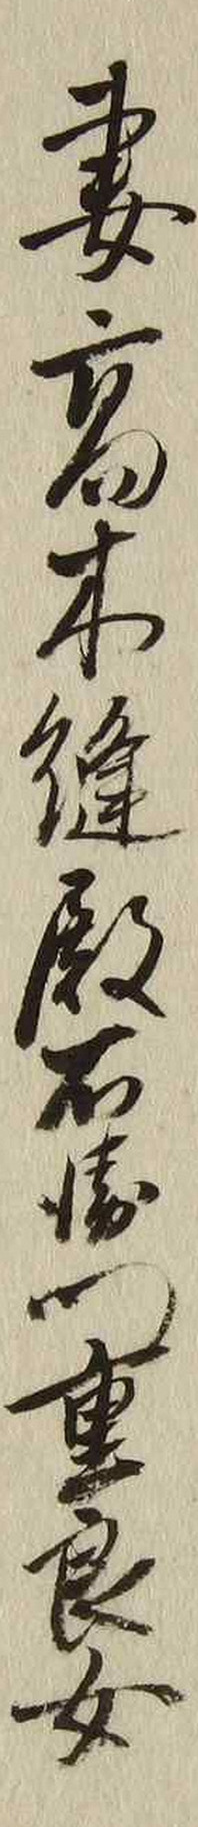妻高木縫殿右衛門重良女
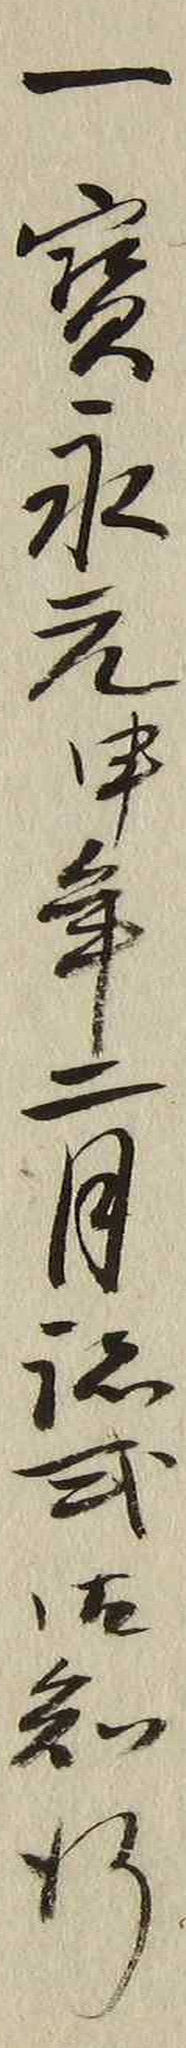一宝永元申年二月跡式御知行
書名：諸士系譜　巻之355　す之部5
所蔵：会津若松市立会津図書館
